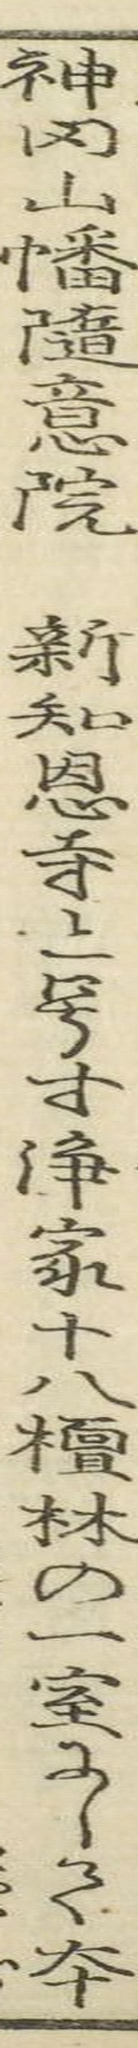神田山幡随意院新知恩寺と号す浄家十八檀林の一室にして本
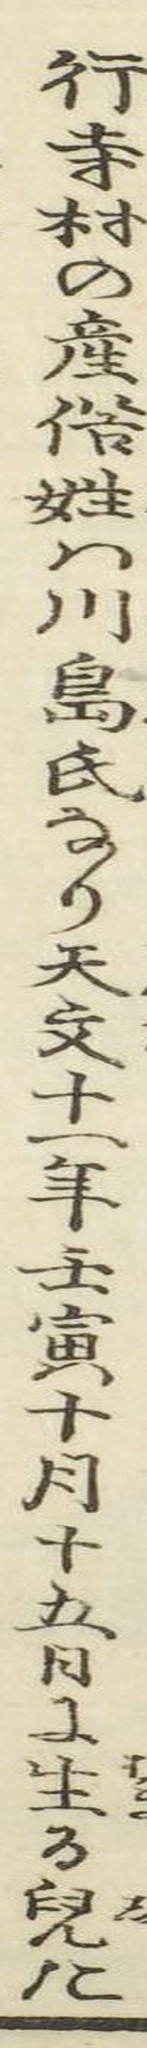行寺村の産俗姓は川島氏なり天文十一年壬寅十月十五日に生る児た
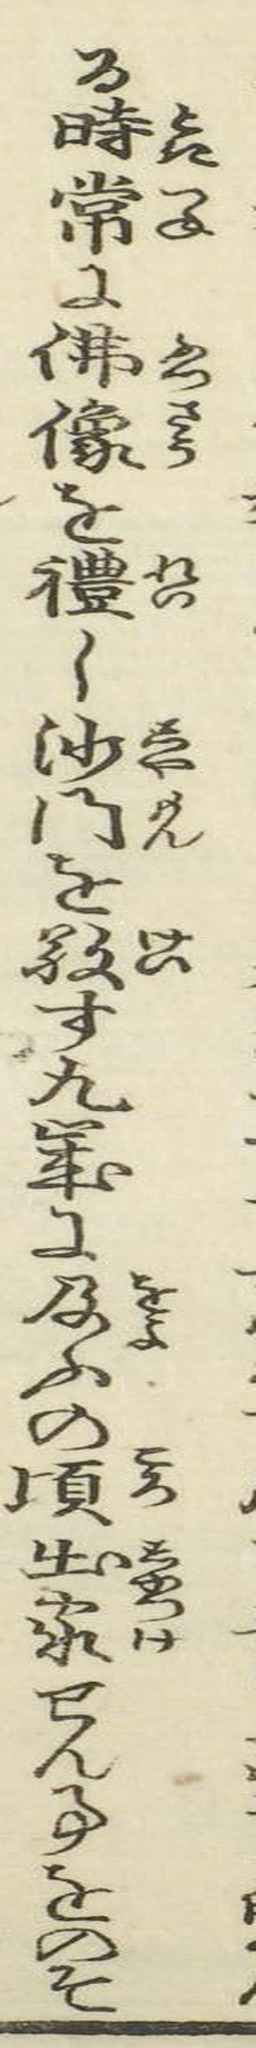る時常に仏像を礼し沙門を敬す九歳に及ふの頃出家せん事をのそ
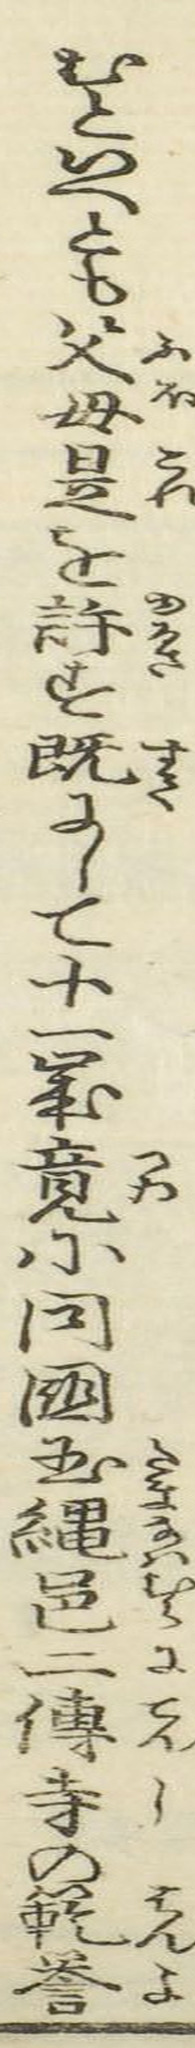むといへとも父母是を許す既にして十一歳竟に同国玉縄邑二伝寺の範誉
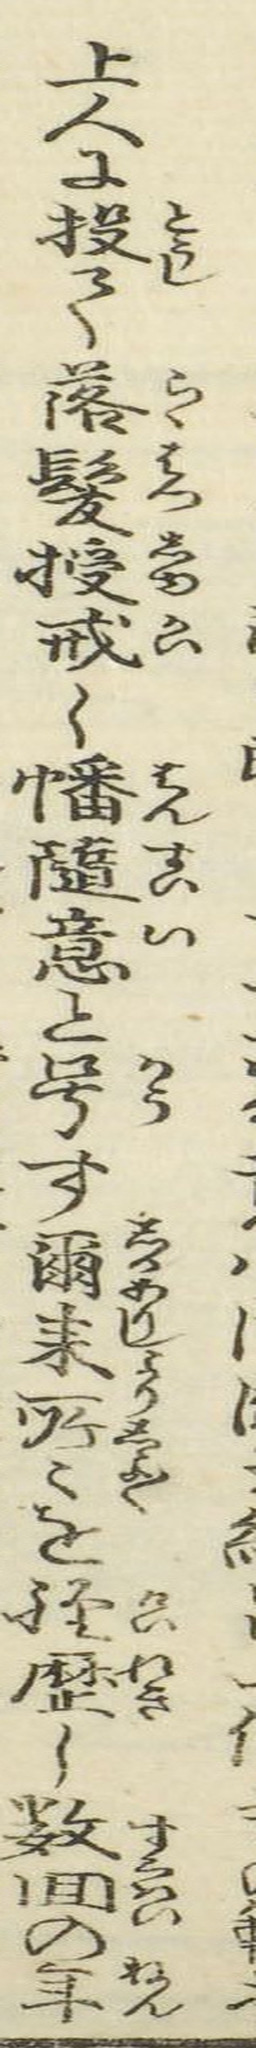上人に投て落髪授戒し幡随意と号す爾来所々を経歴し数回の年
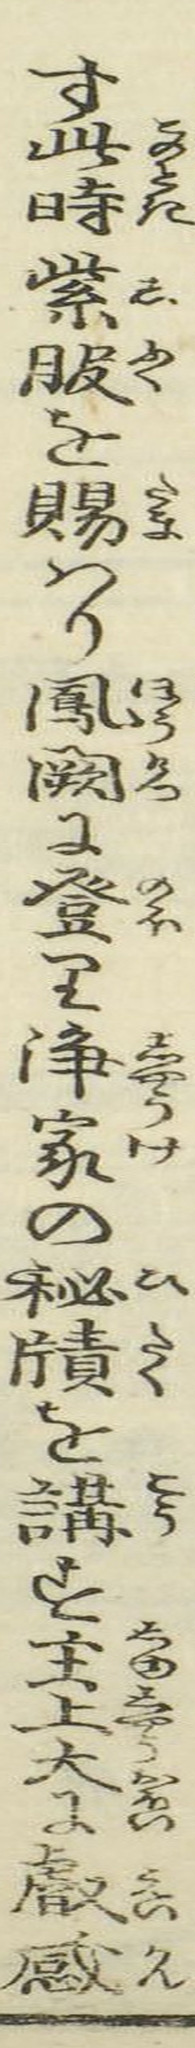す此時紫服を賜はり鳳闕に登り浄家の秘牘を講す主上大に叡感

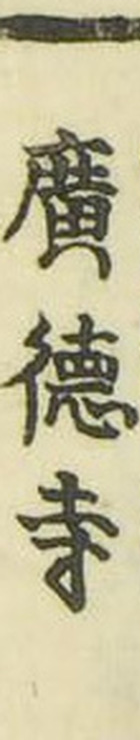廣徳寺

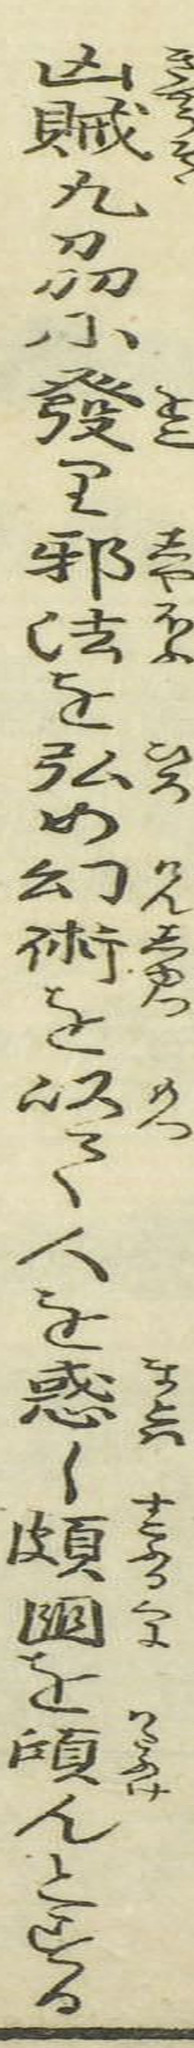凶賊九州に発り邪法を弘め幻術を以て人を惑し頗国を傾んとする
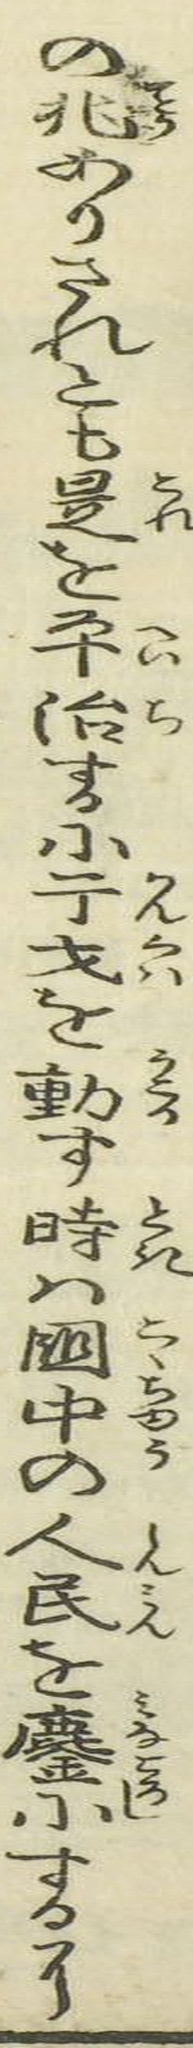の兆ありされとも是を平治するに干戈を動す時は国中の人民を鏖にするに
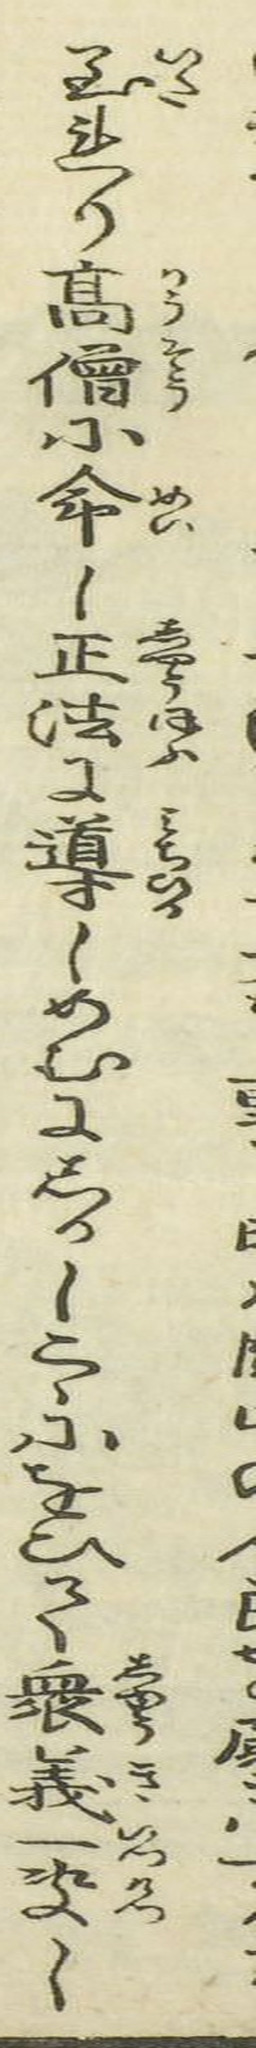至れり高僧に命し正法に導しめむにしかしこゝにをひて衆義一決し
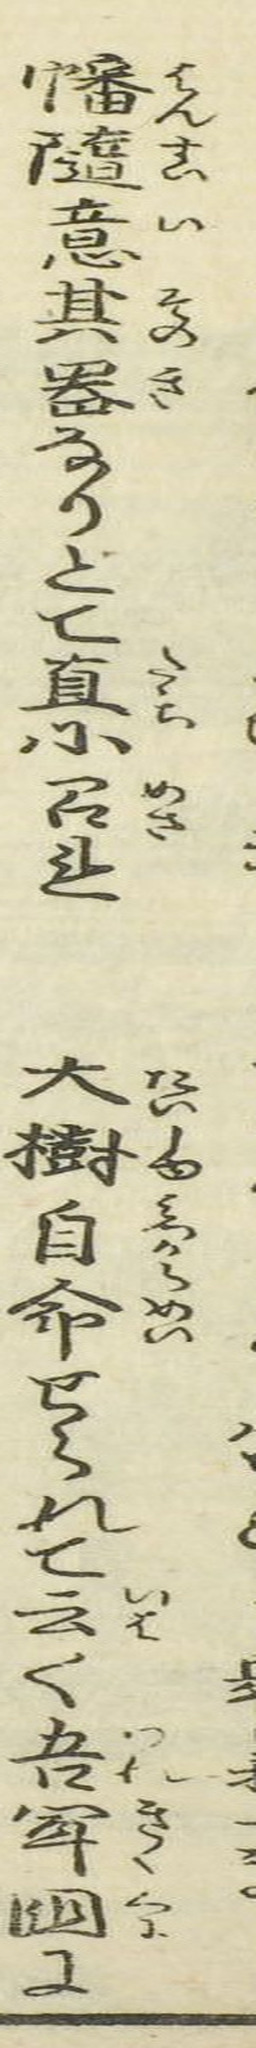幡随意其器なりとて直に召れ大樹自命せられて云く吾聞国に
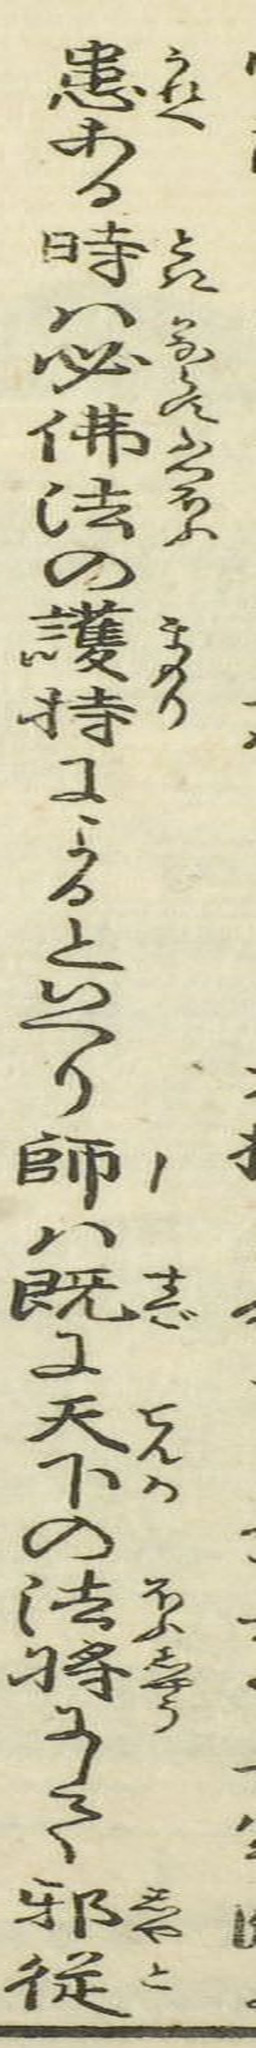患ある時は必仏法の護持によるといへり師は既に天下の法将にして邪徒
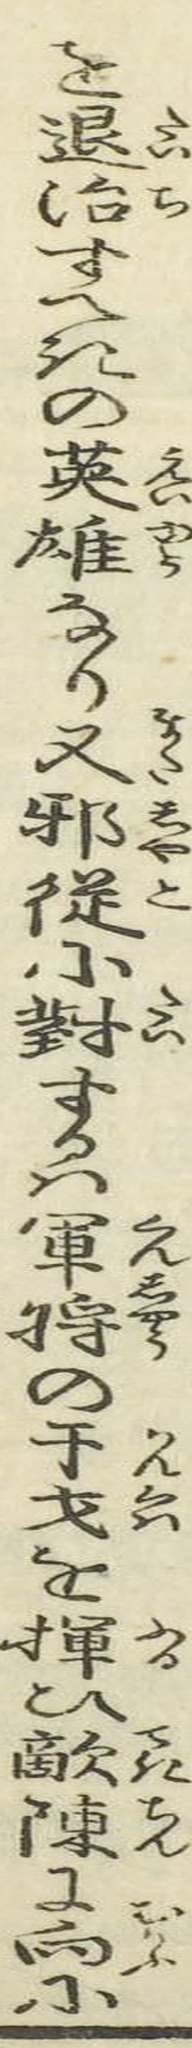を退治すへきの英雄なり又邪徒に対するは軍将の干戈を揮ひ敵陣に向に
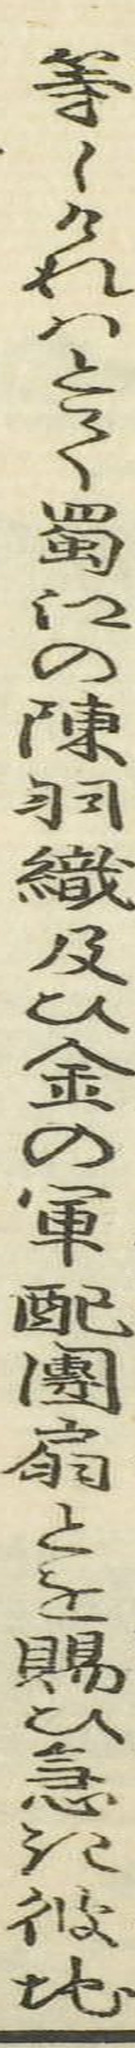等しけれはとて蜀江の陣羽織及ひ金の軍配団扇とを賜ひ急き彼地
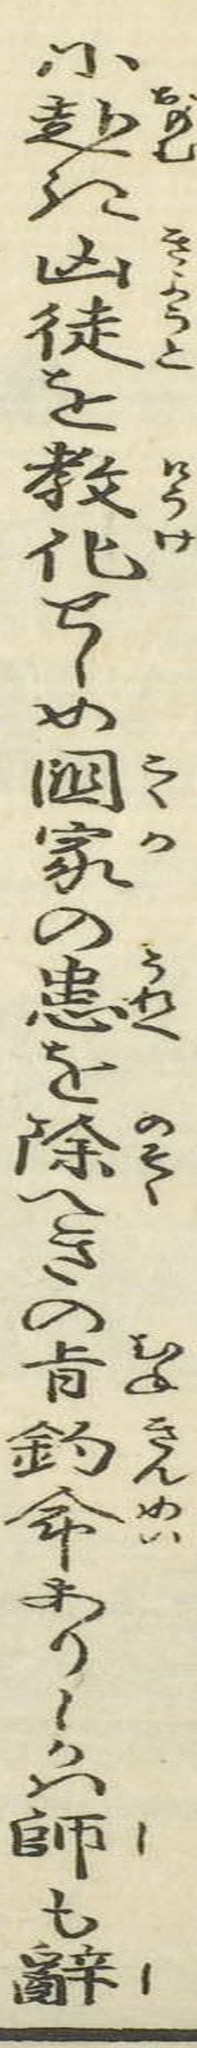に赴き凶徒を教化せしめ国家の患を除へきの旨鈞命ありしかは師も辞
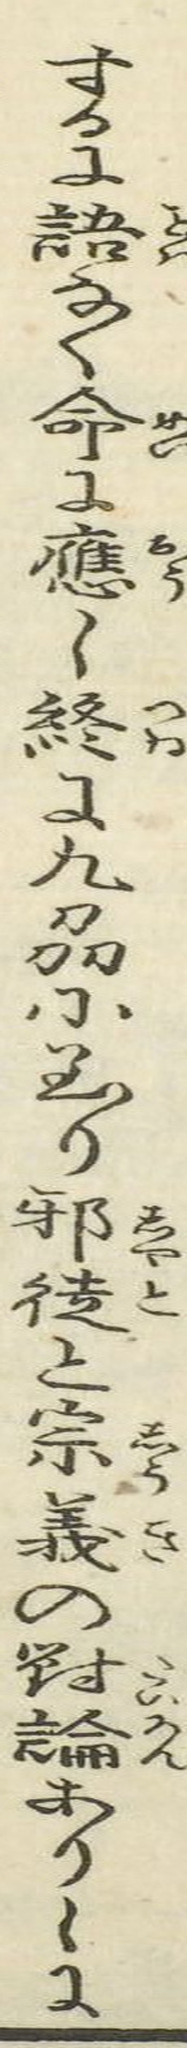するに語なく命に応し終に九州に至り邪徒と宗義の対論ありしに
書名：江戸名所図会 20巻 巻之16
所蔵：東京学芸大学教育コンテンツアーカイブ
